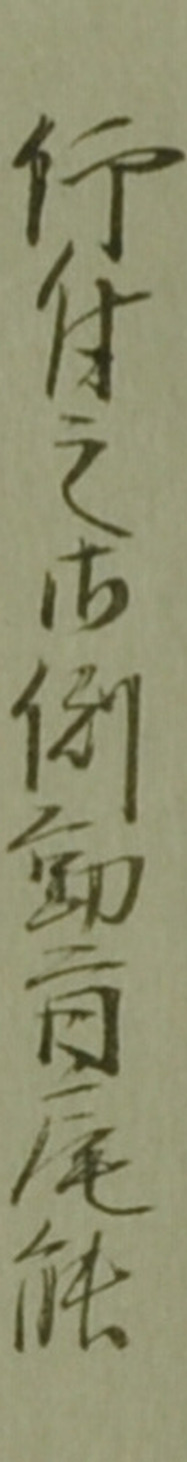仰付之御側勤首尾能
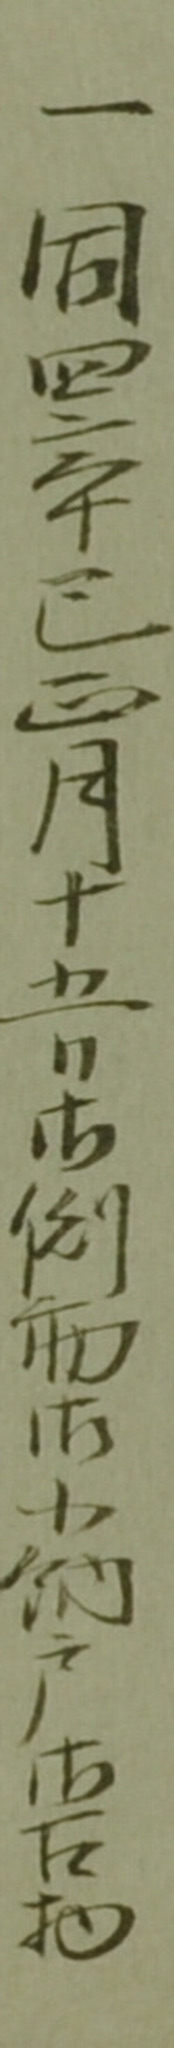一同四辛巳正月十五日御側勤御小納戸御召物
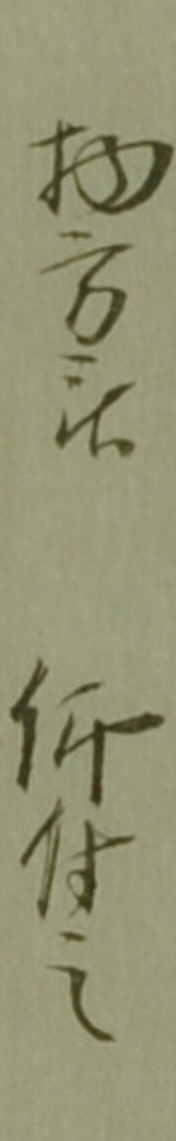物方被仰付之
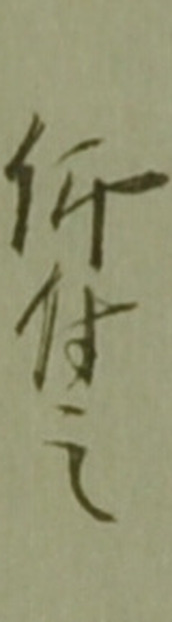仰付之
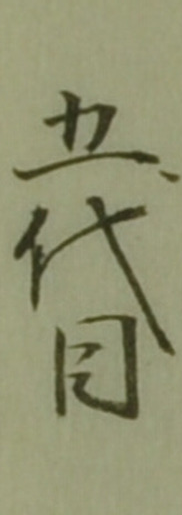五代目
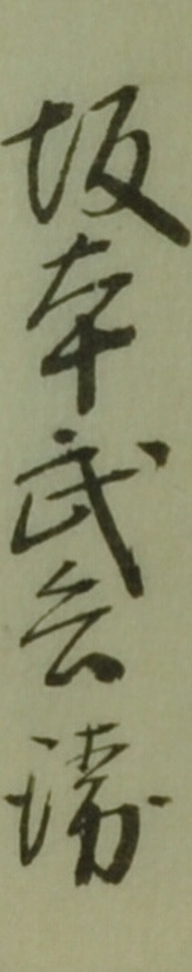坂本武兵衛
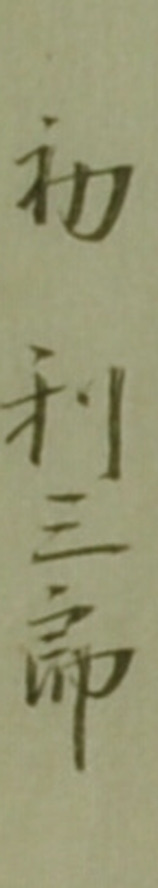初利三郎
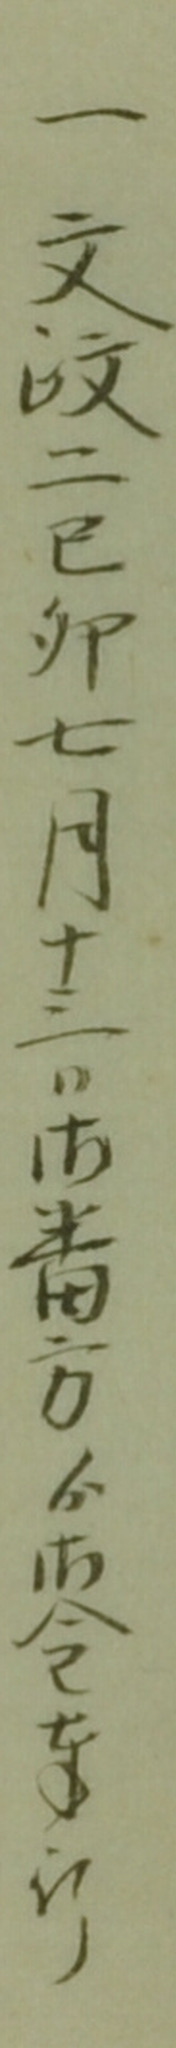一文政二己卯七月十三日御番方ゟ御金奉行
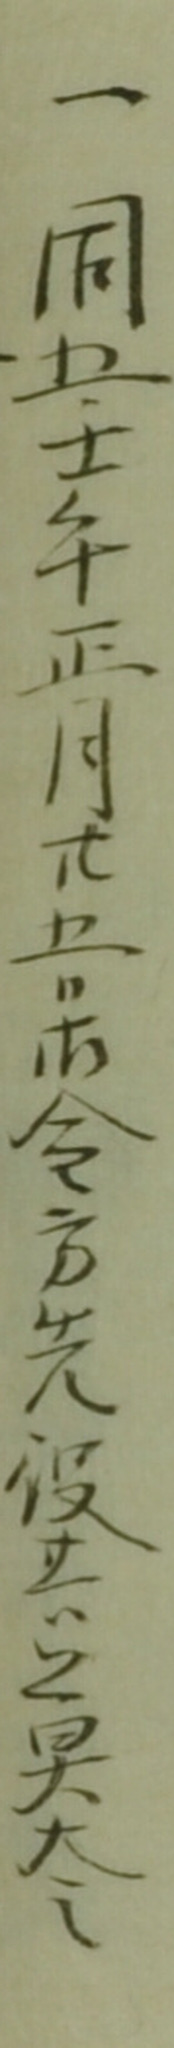一同五壬午正月廿五日御金方先役共莫大之
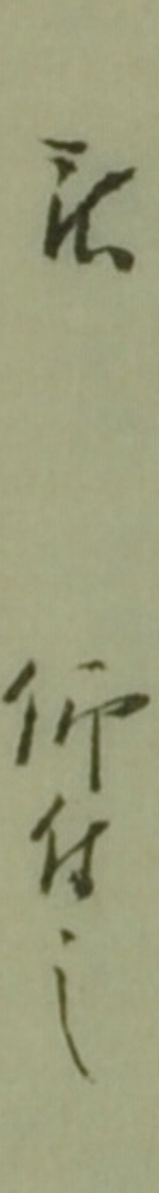被仰付之
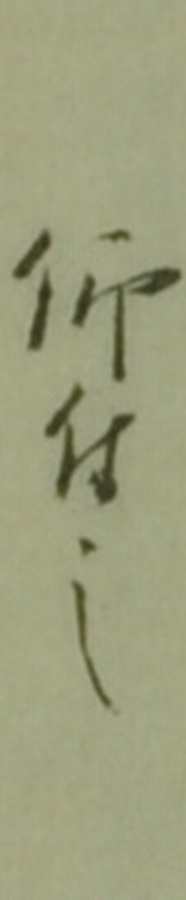仰付之
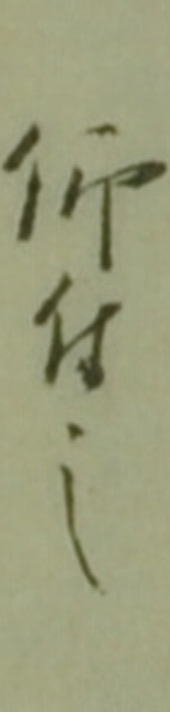仰付之
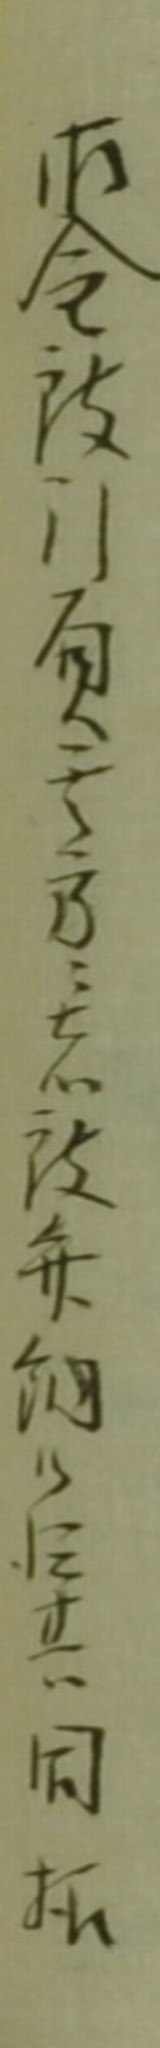御金致引負其方者致弁納候得共同様
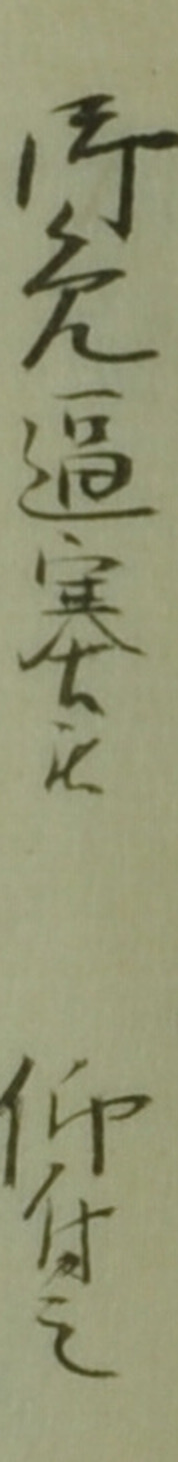御免逼塞被仰付之
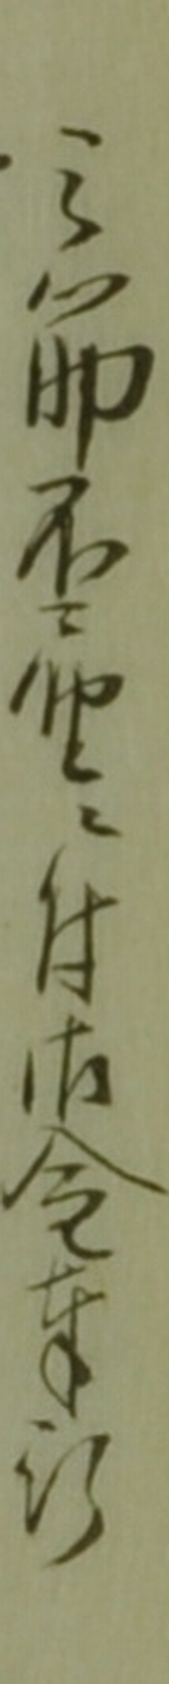之筋不届付御金奉行
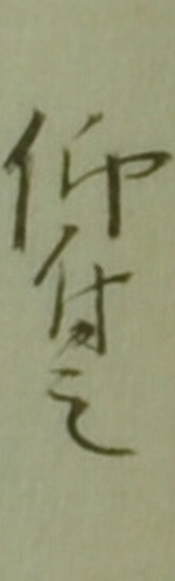仰付之
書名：諸御役代々録（七）
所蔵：伊那市立高遠町図書館・合同会社AMANE
